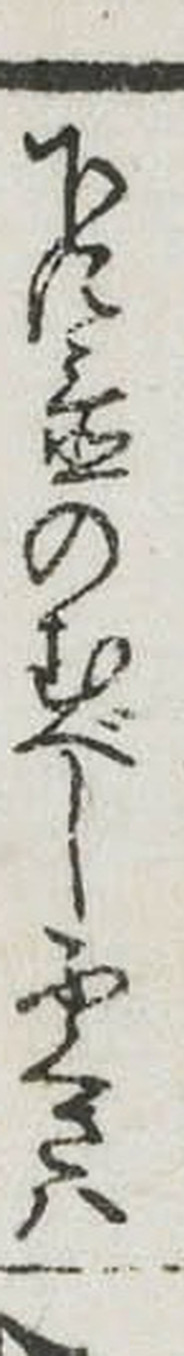下に置のむべしふくさは
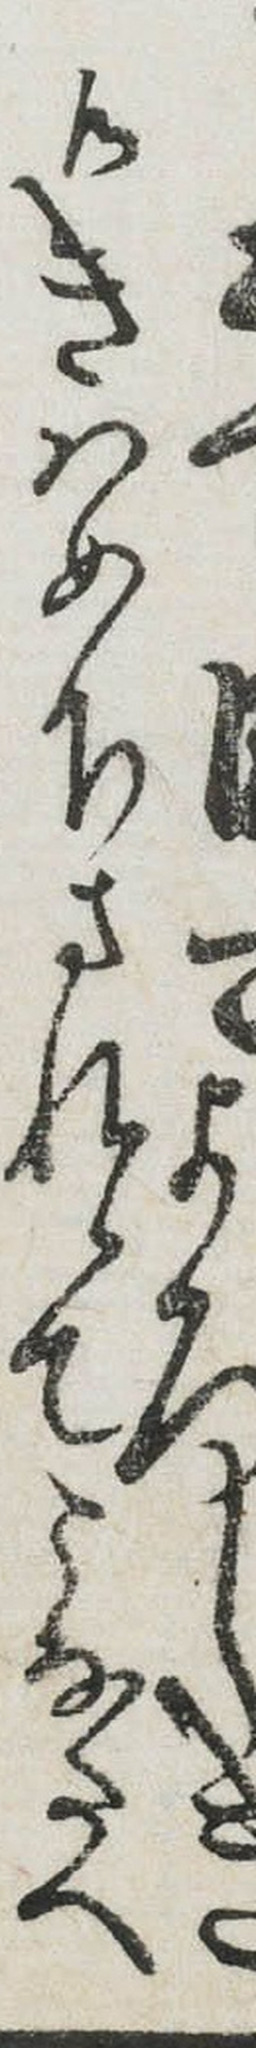御きはめ下され候てこなたへ
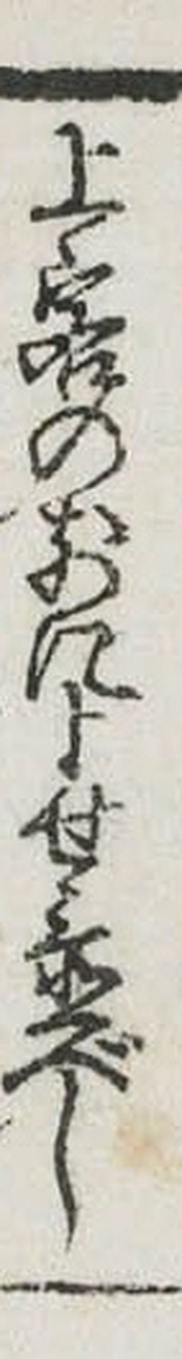上客の前によせ置べし
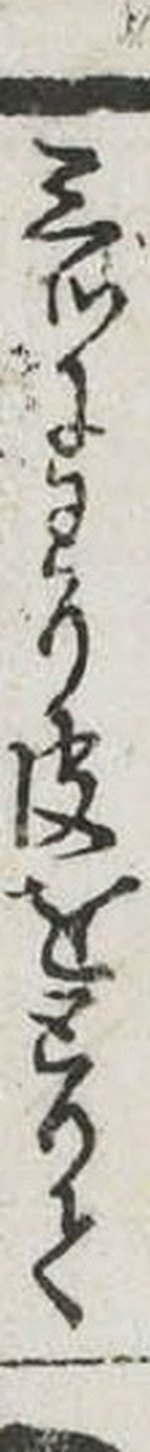三ッにわり皮をとりて
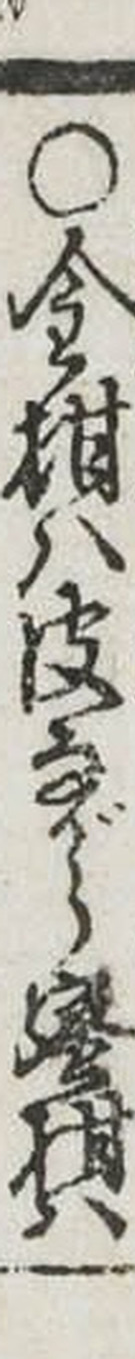○金柑は皮ながら蜜柑は
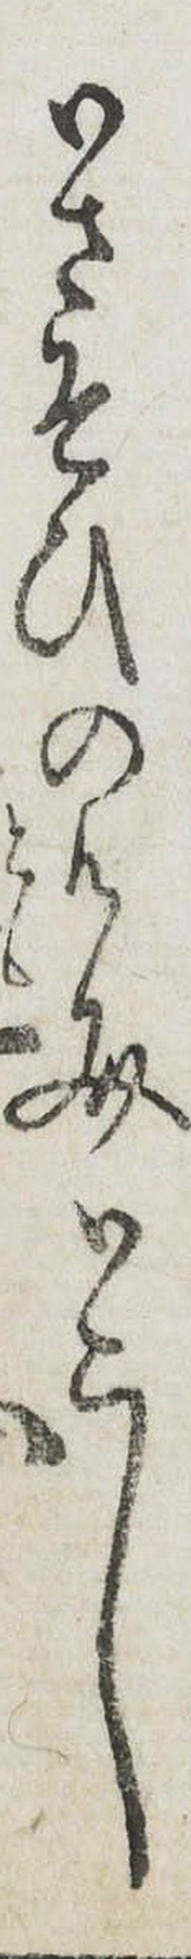御さそひの御文御こし
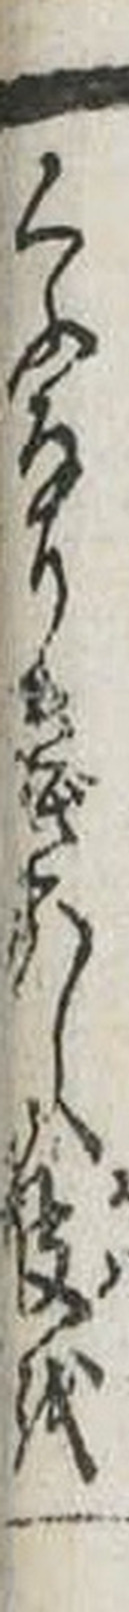くふなりきざはしは皮を
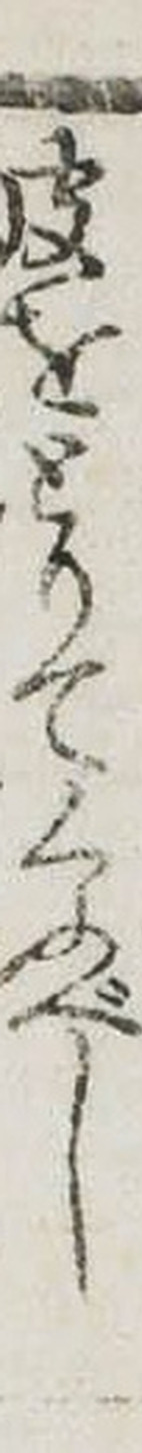皮をとりてくふべし
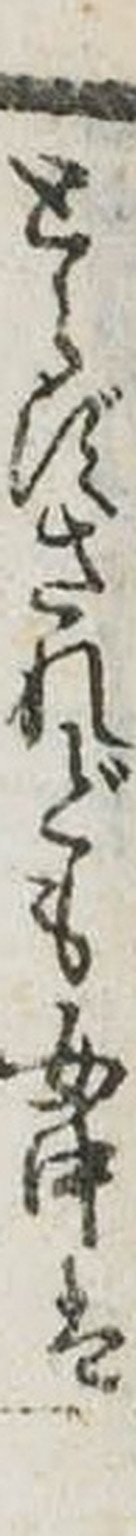とらずされども女中は
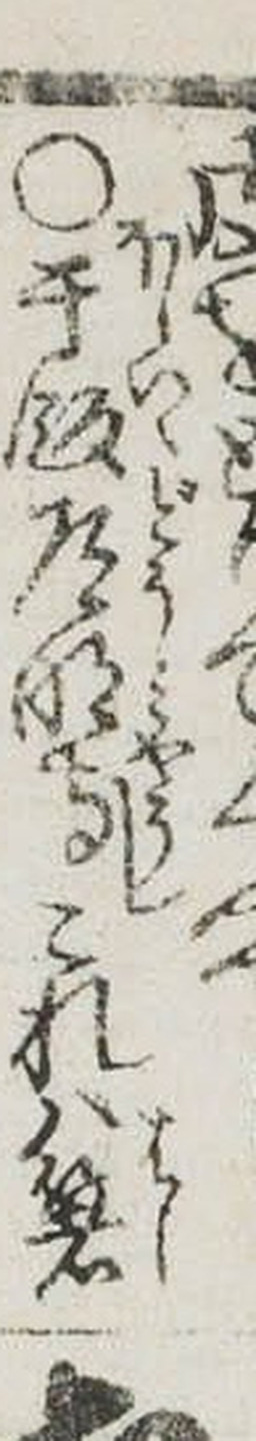○干飯道明寺これは箸
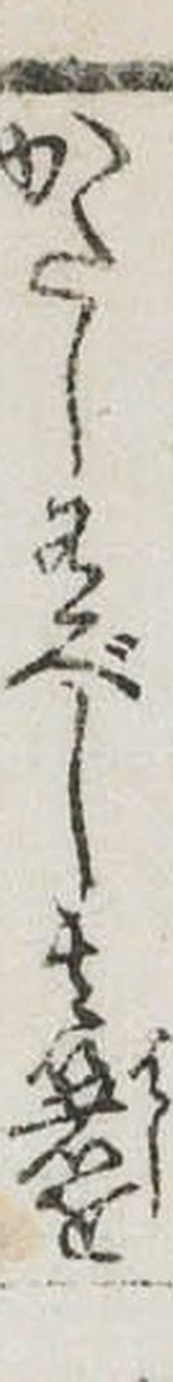かたし有べし其箸を
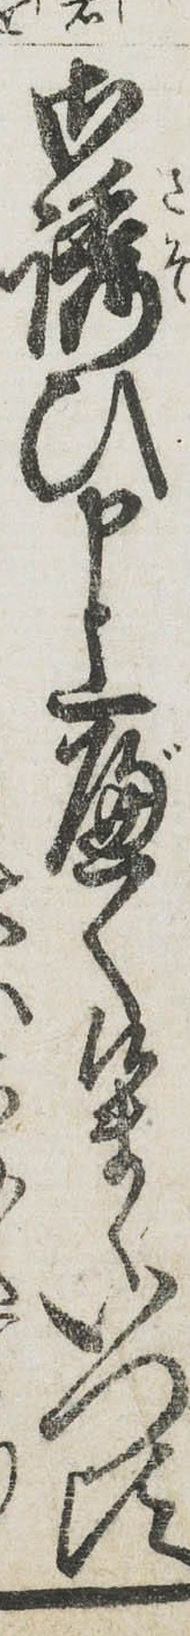御誘ひ申上べく候まゝいつ頃
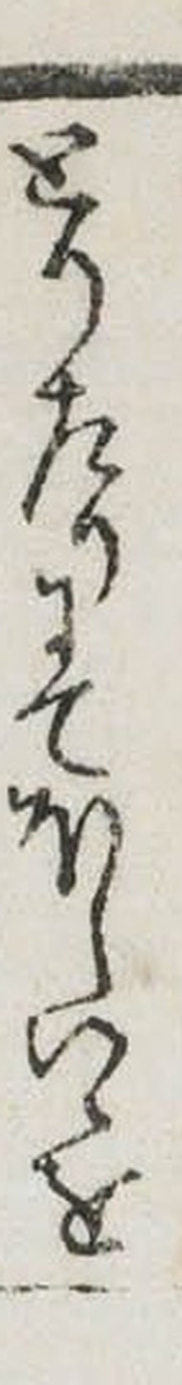とりたるにてほしいゝを
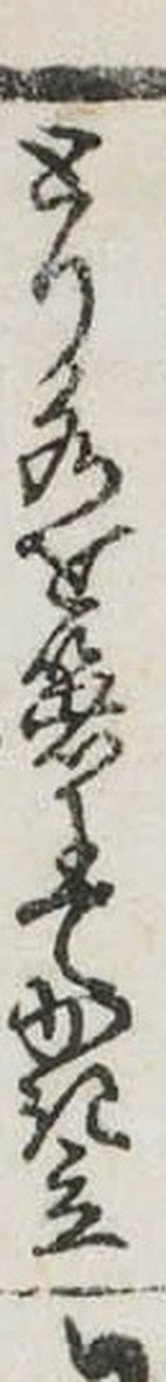とり水を箸にてかき立
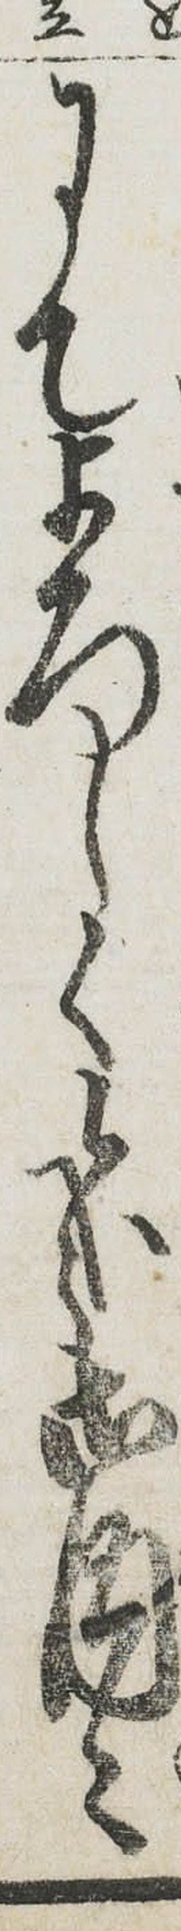にてよろしく候哉御内々
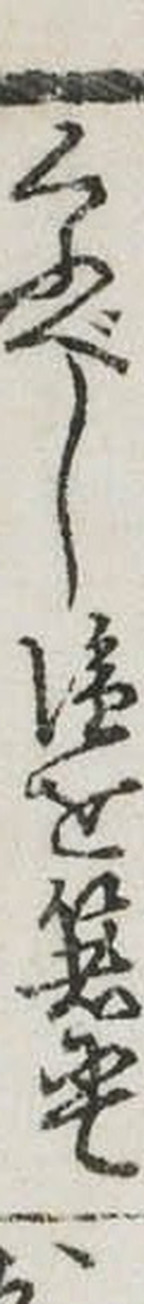くふべし塩を箸にて
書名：頭書萬用婦人手紙之文言
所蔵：東京学芸大学教育コンテンツアーカイブ
